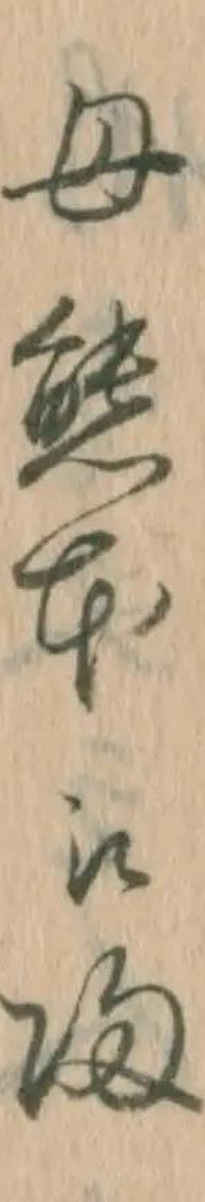母熊本江帰
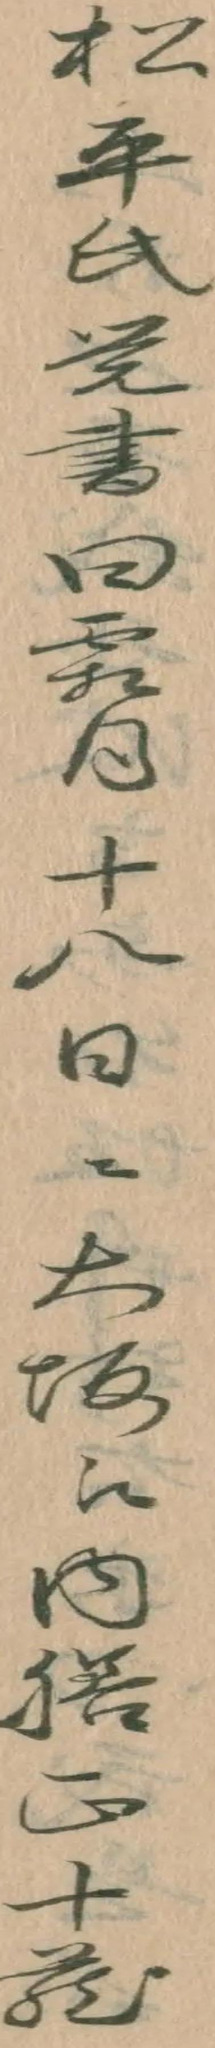松平氏覚書曰霜月十八日に大坂江内膳正十蔵
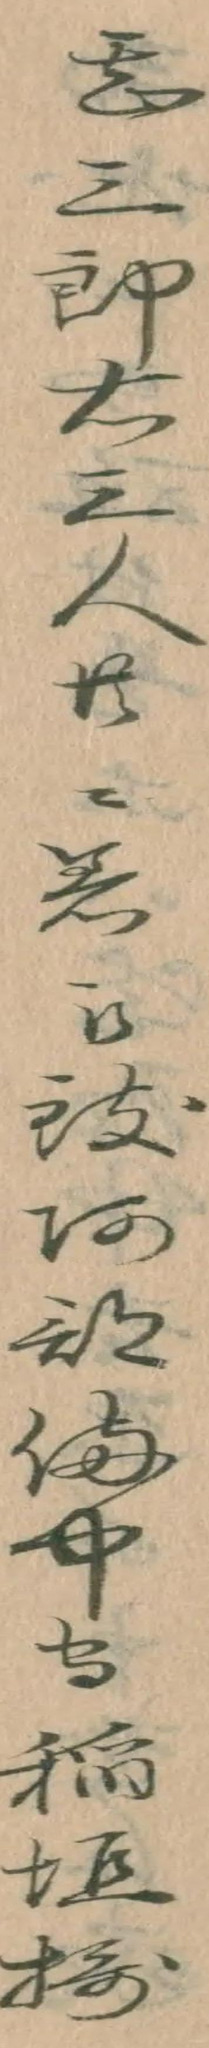甚三郎右三人共に着被致阿倍備中守稲垣摂
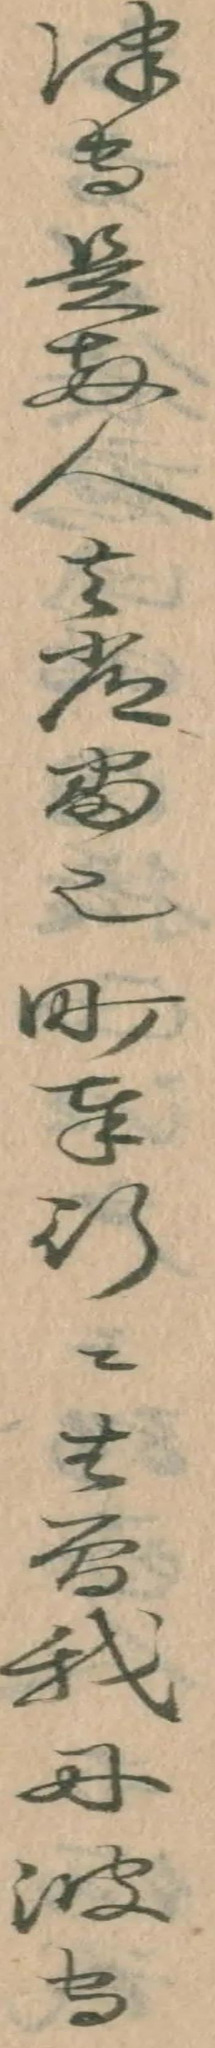津守是両人は常番之町奉行には曽我丹波守
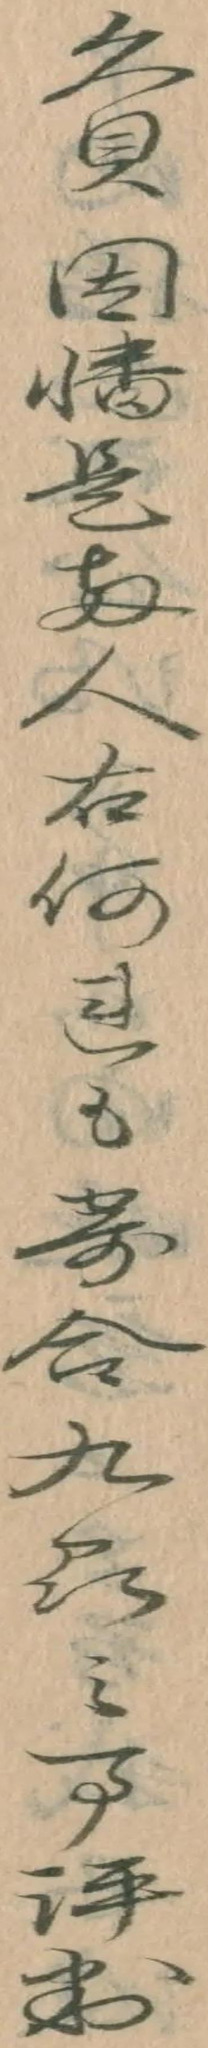久貝因幡是両人右何れも寄合九州之事評判
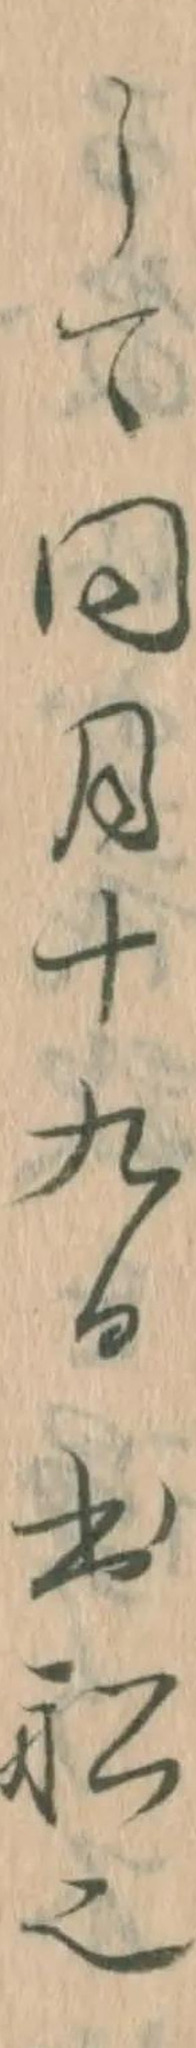して同月十九日出船也
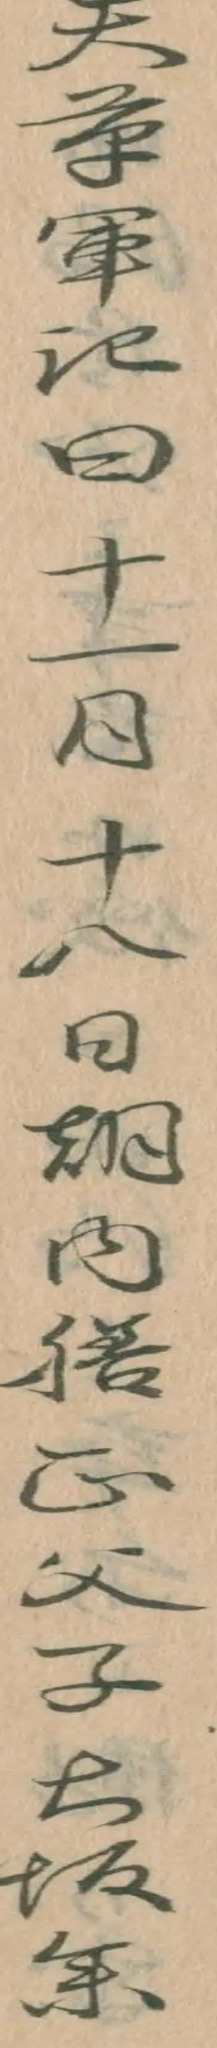天草軍記曰十一月十八日朝内膳正父子大坂参
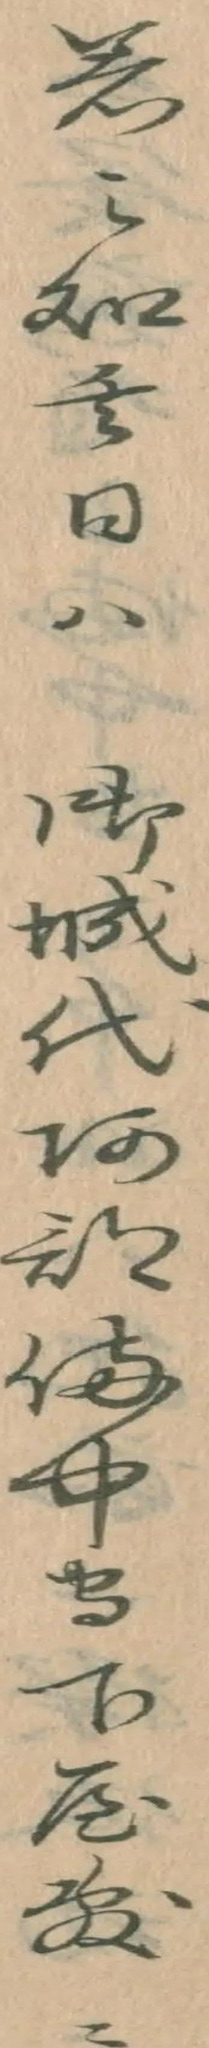着之処其日は御城代阿倍備中守下屋敷に

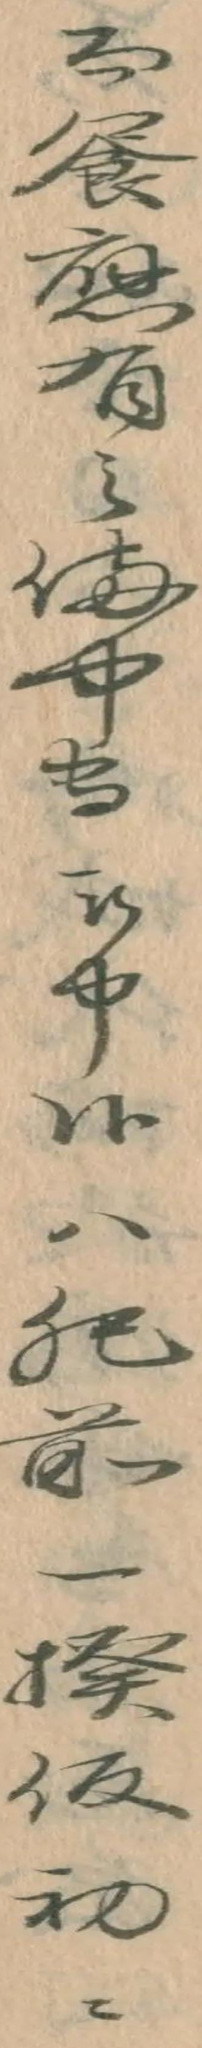而饗応有之備中守被申候は肥前一揆仮初に
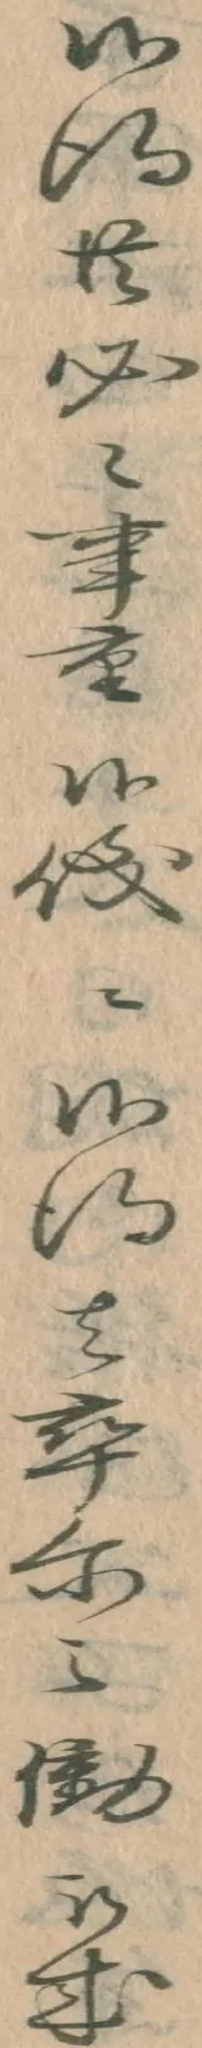候得共必々事重候儀に候得は卒尓之働被成
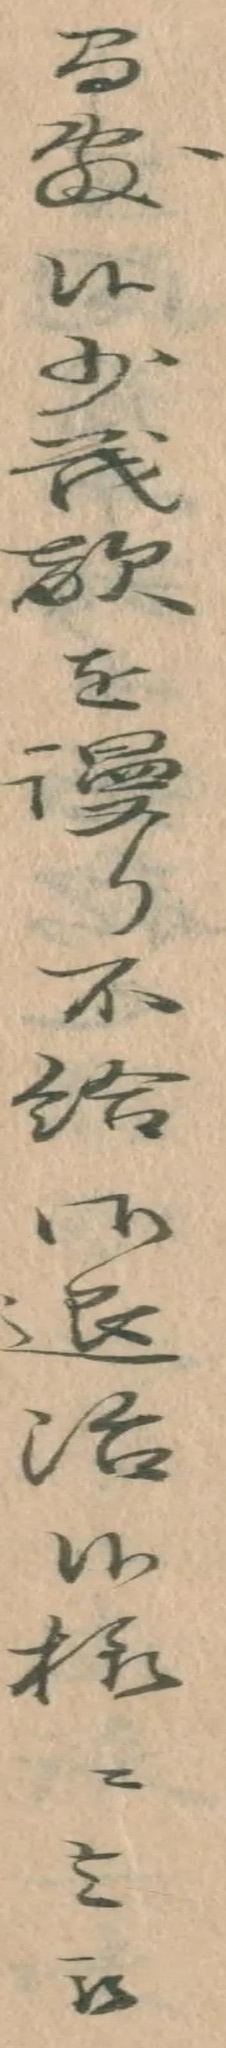間敷候少も敵を謾り不給御退治候様にと被
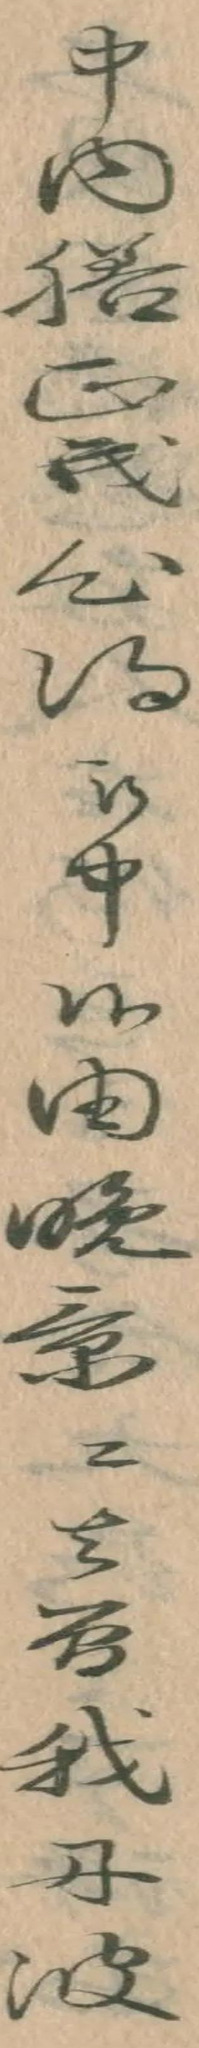申内膳正も心得被申候由晩景には曽我丹波
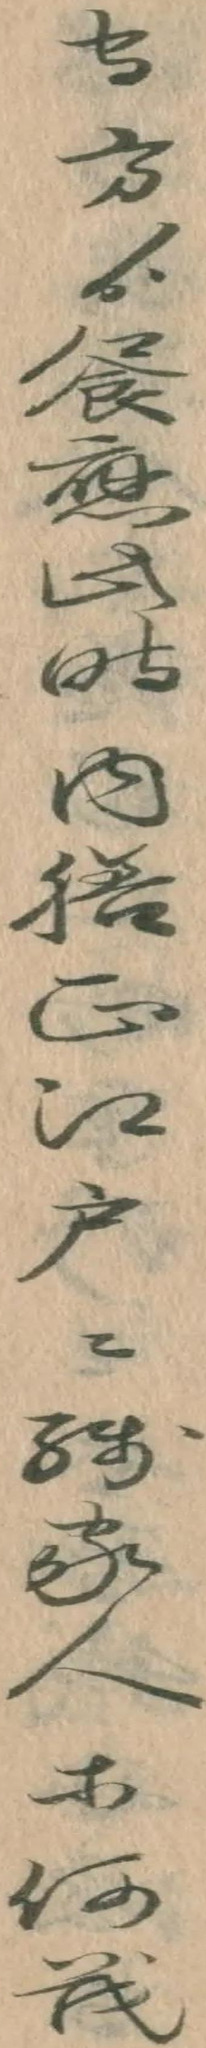守方ゟ饗応此時内膳正江戸に残家人等何も
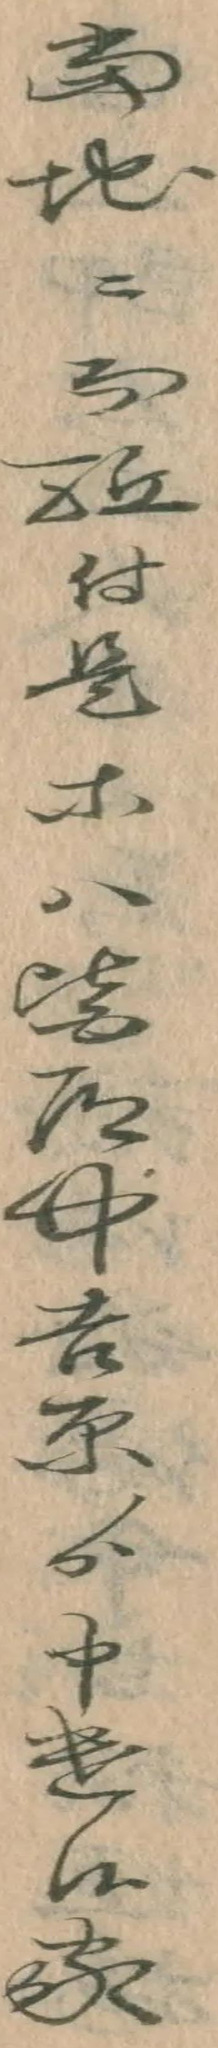当地に而駆付是等は皆道中吉原ゟ申遣候家
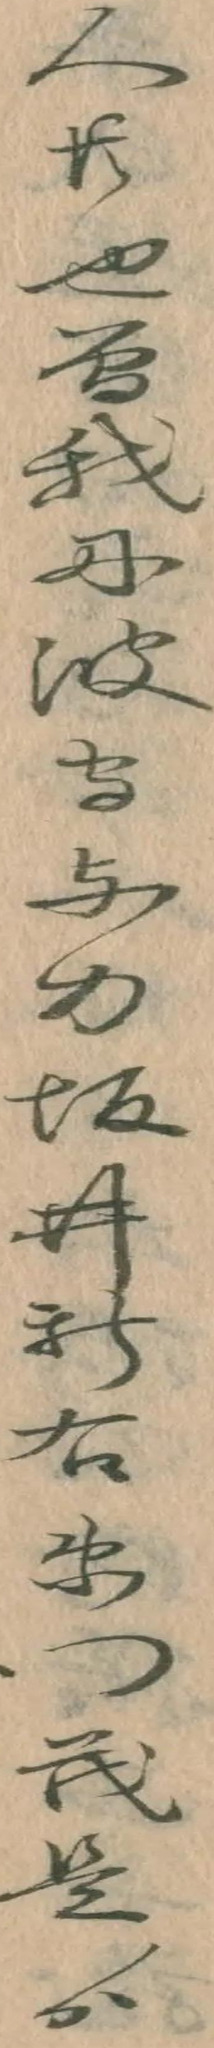人共也曽我丹波守与力坂井新右衛門も是ゟ
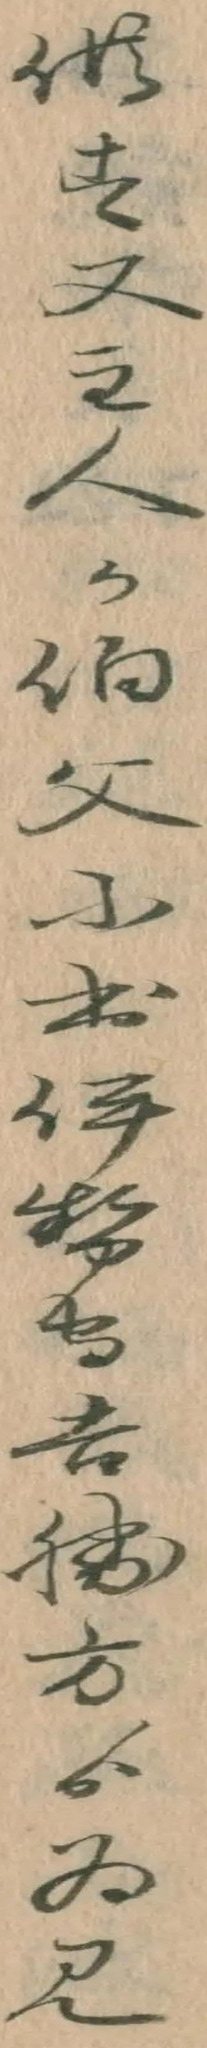供す又主人か伯父小出伊勢守吉勝方ゟ為見
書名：切支丹御退治記 49巻. [3]
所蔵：国立国会図書館 National Diet Library, JAPAN
